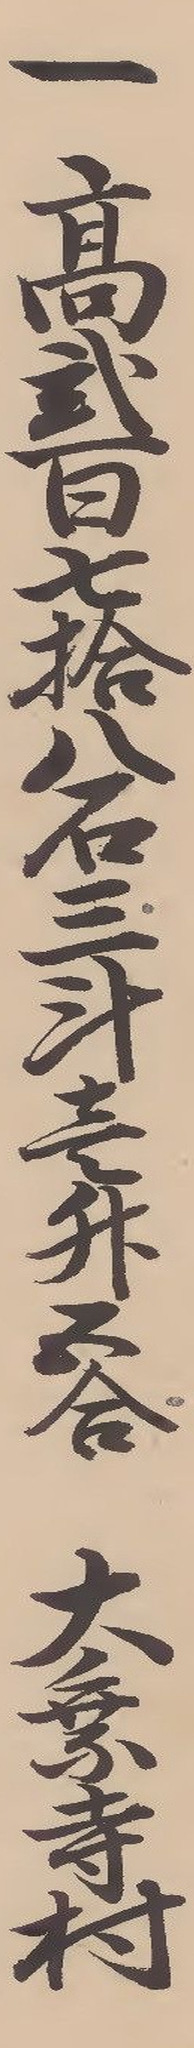一高弐百七拾八石三斗壱升五合大乗寺村
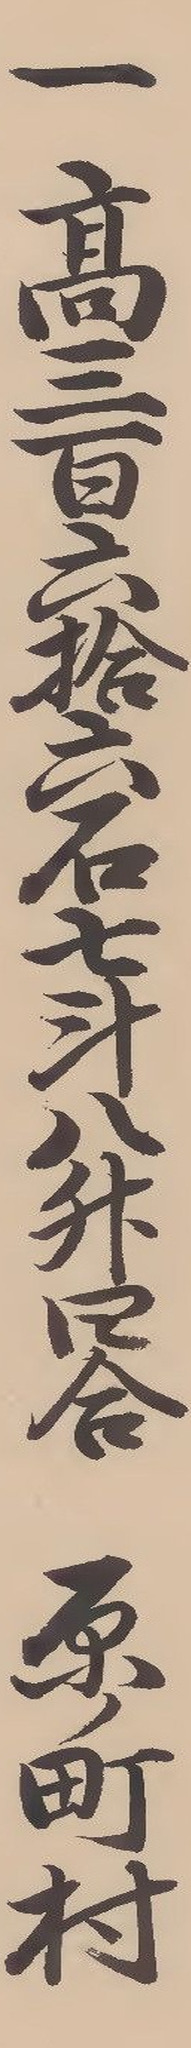一高三百六拾六石七斗八升四合原ノ町村
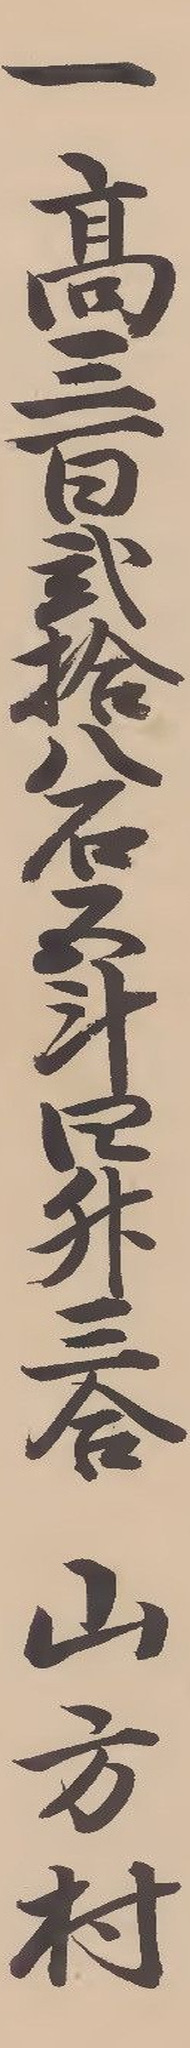一高三百弐拾八石五斗四升三合山方村
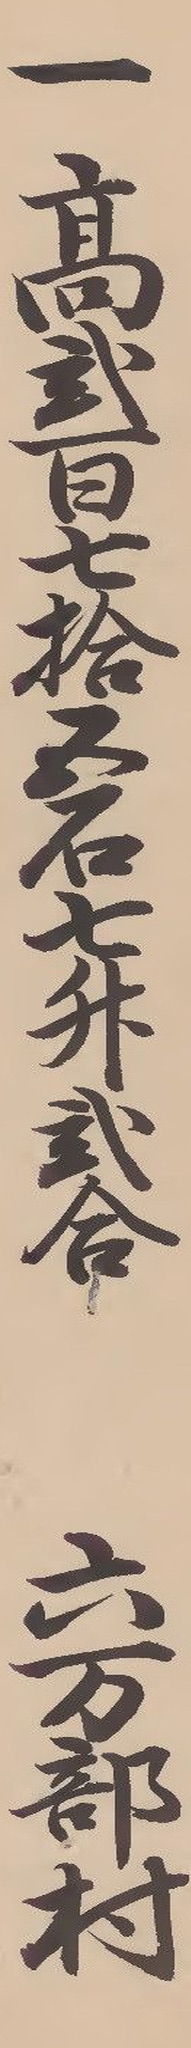一高弐百七拾五石七升弐合六万部村
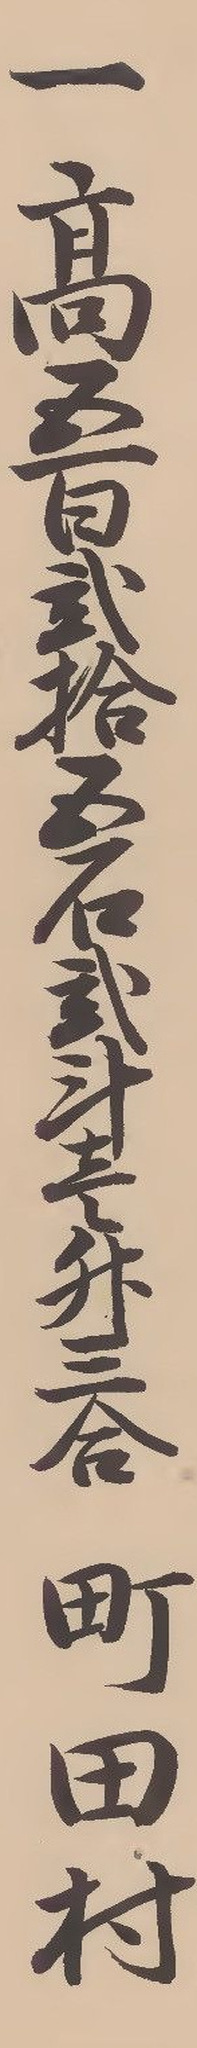一高五百弐拾五石弐斗壱升三合町田村
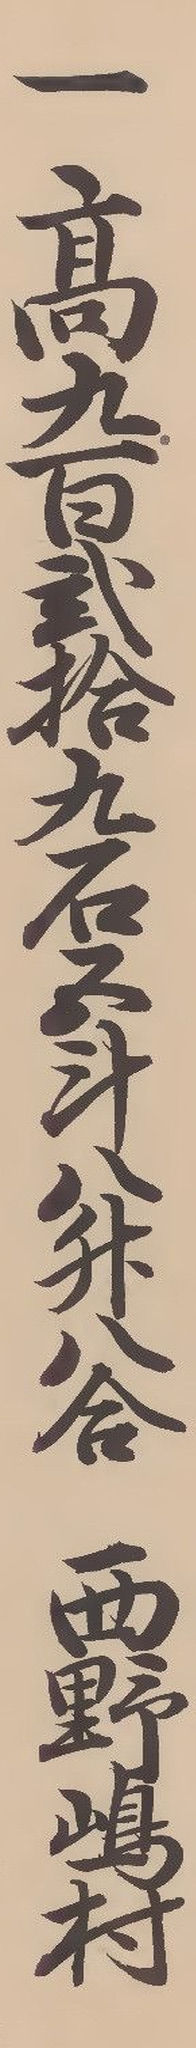一高九百弐拾九石五斗八升八合西野島村
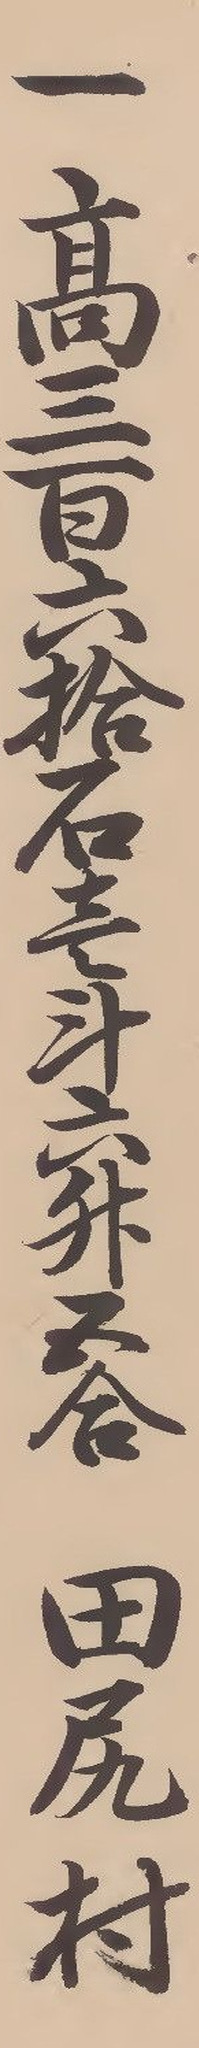一高三百六拾石壱斗六升五合田尻村
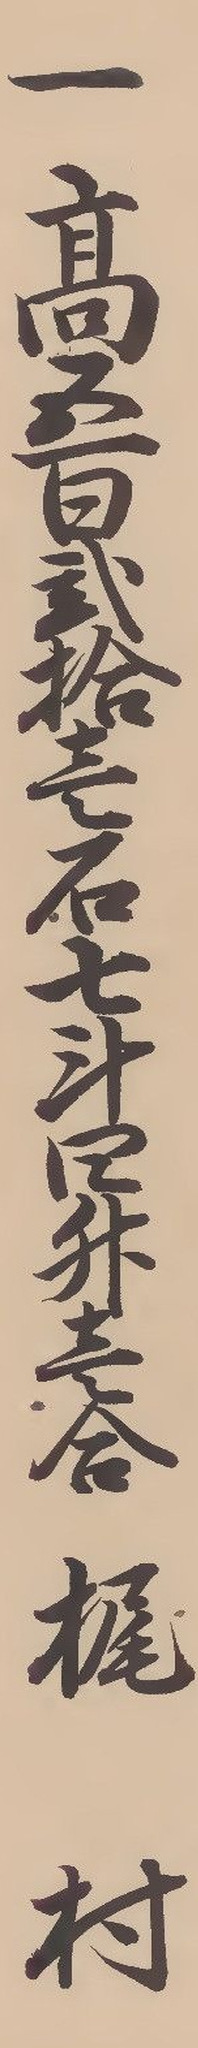一高五百弐拾壱石七斗四升壱合梶村

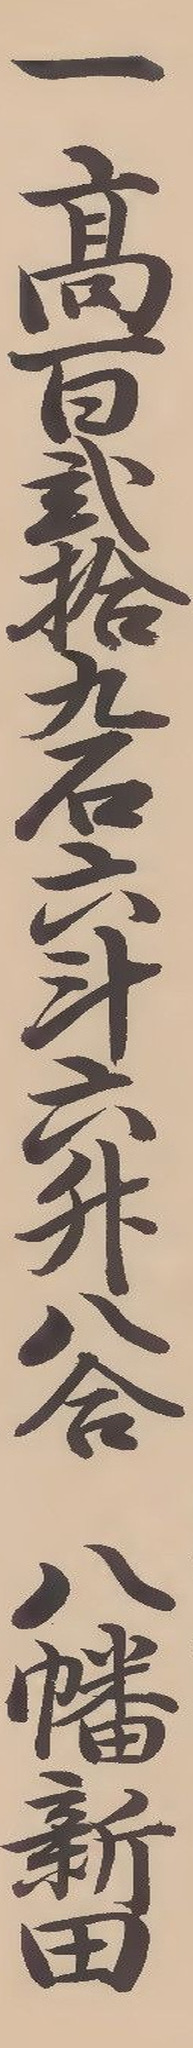一高百弐拾九石六斗六升八合八幡新田
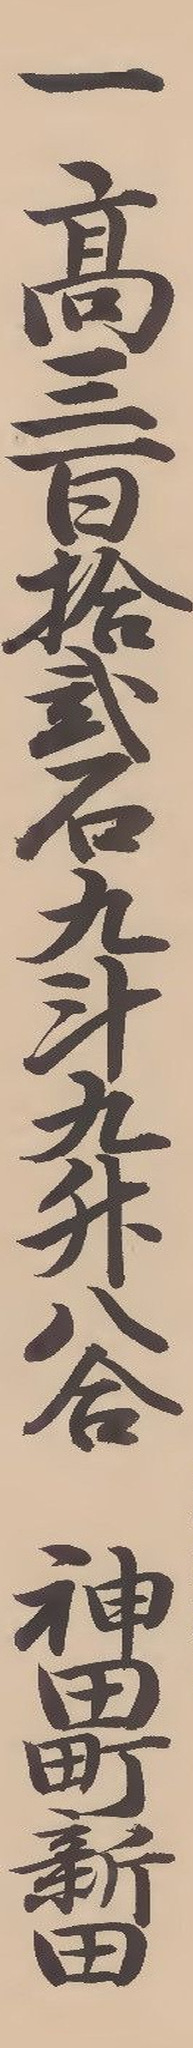一高三百拾弐石九斗九升八合神田町新田
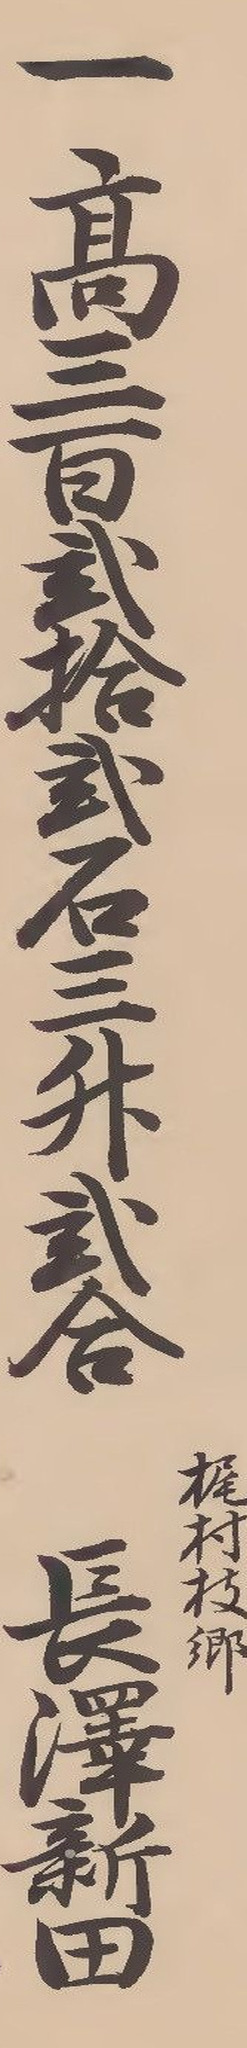一高三百弐拾弐石三升弐合長沢新田
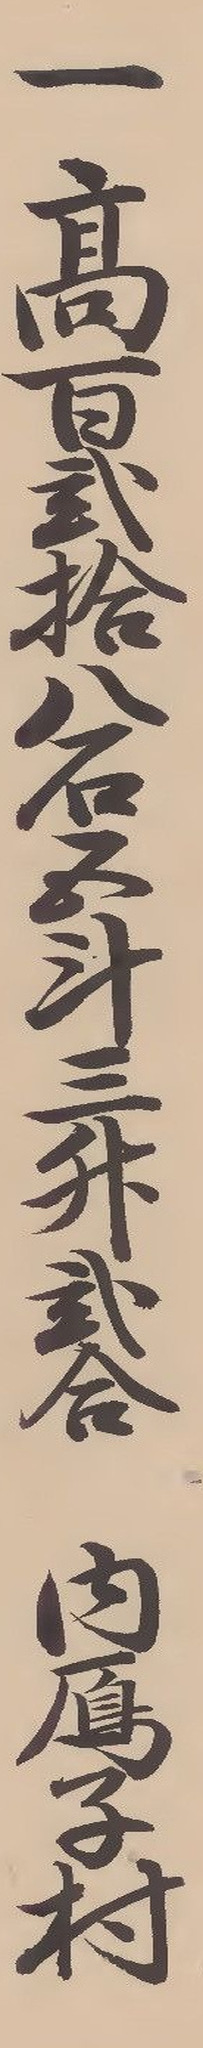一高百弐拾八石五斗三升弐合内雁子村
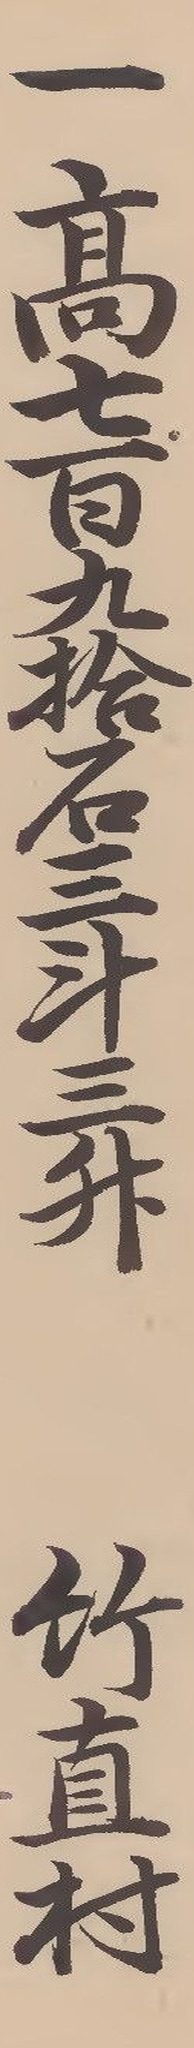一高七百九拾石三斗三升竹直村
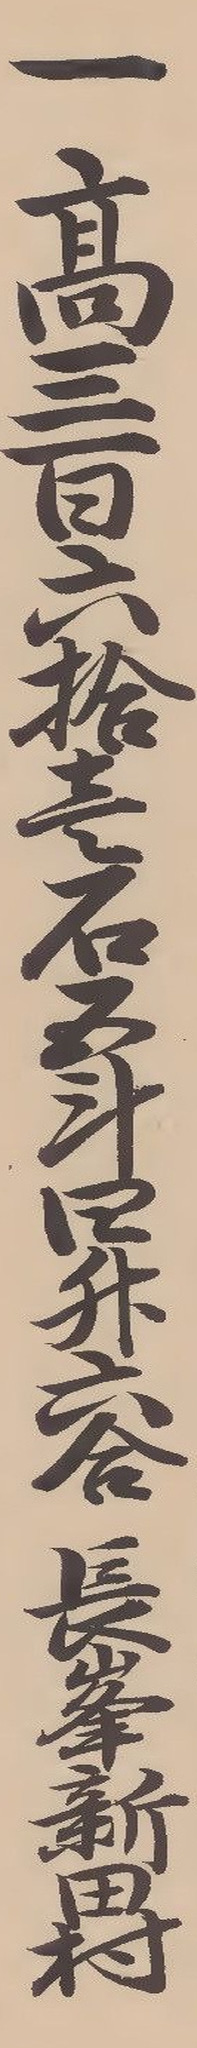一高三百六拾壱石五斗四升六合長峯新田村
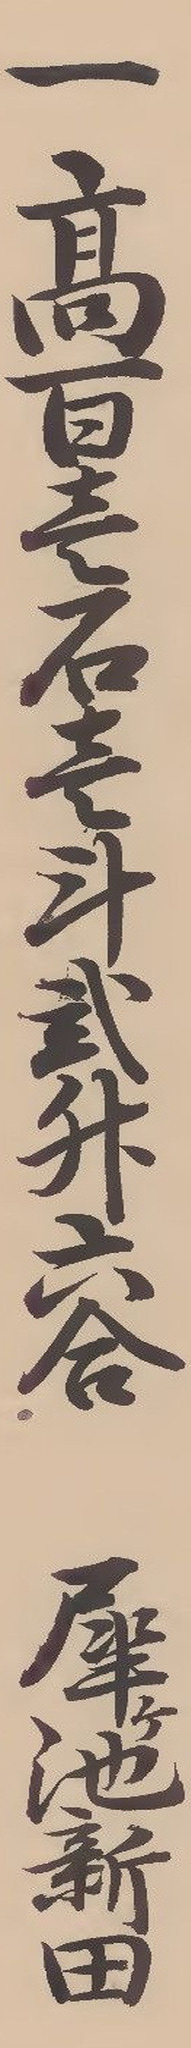一高百壱石壱斗弐升六合犀ヶ池新田

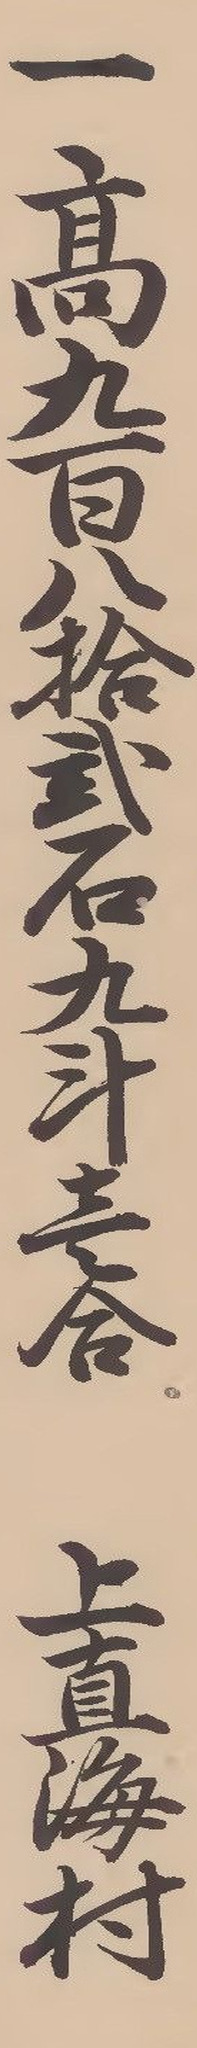一高九百八拾弐石九斗壱合上直海村
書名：越後国郷帳　上
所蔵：国立公文書館 National Archives of Japan
